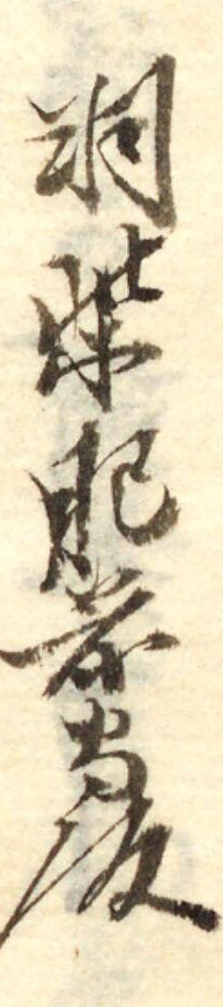羽柴肥前守殿
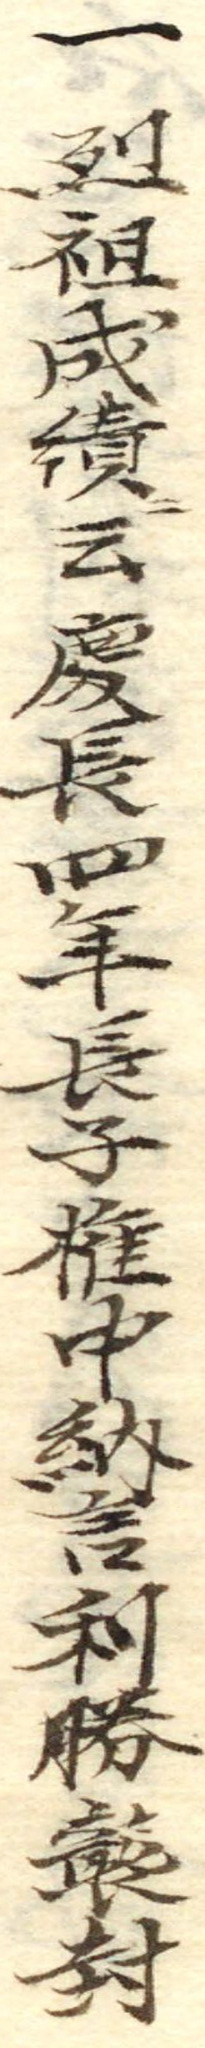一烈祖成績に云慶長四年長子権中納言利勝襲封
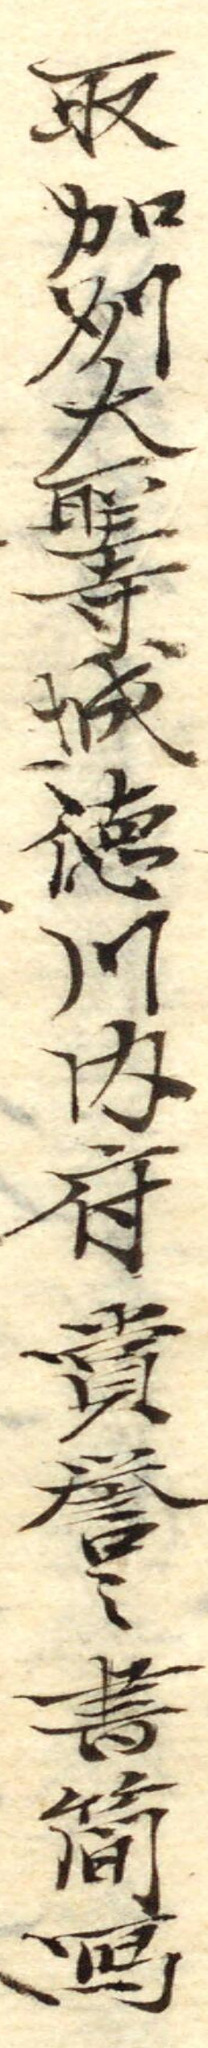取加州大聖寺城德川内府賞誉之書簡写
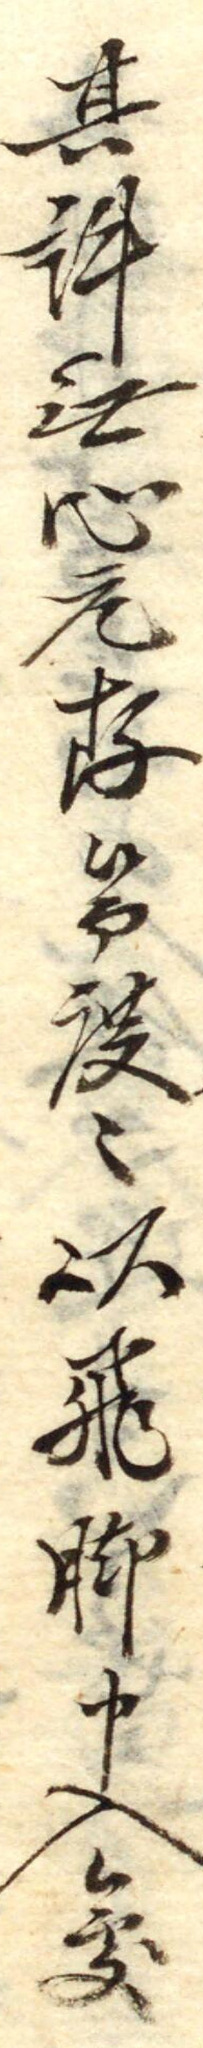其許無心元存候而度々以飛脚申入候處
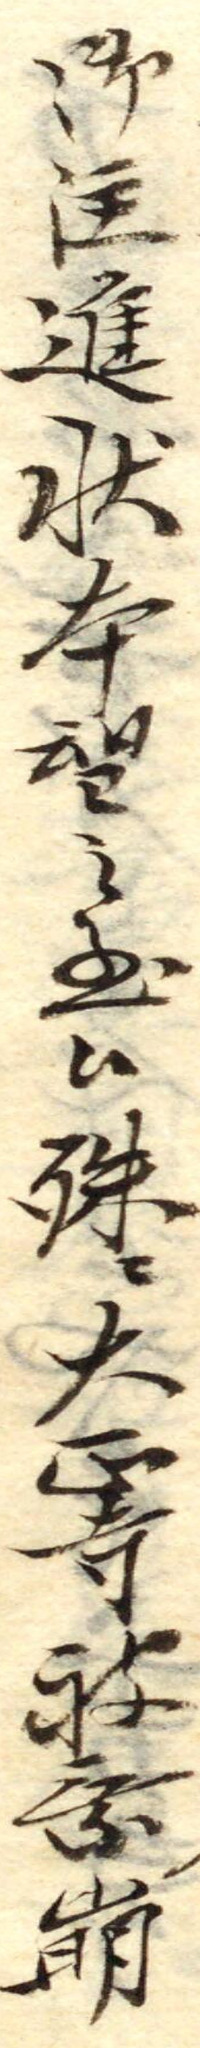御注進状本望之至候殊に大正寺被乗崩
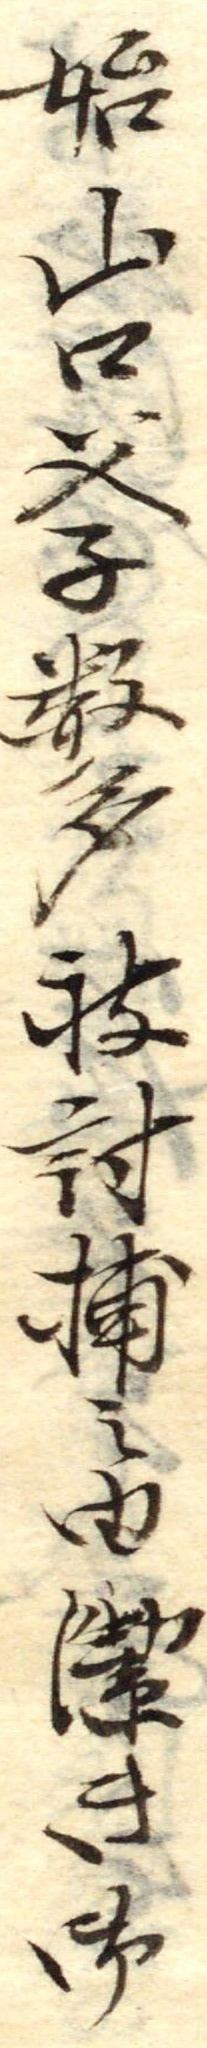始山口父子数多被討捕之由潔き御
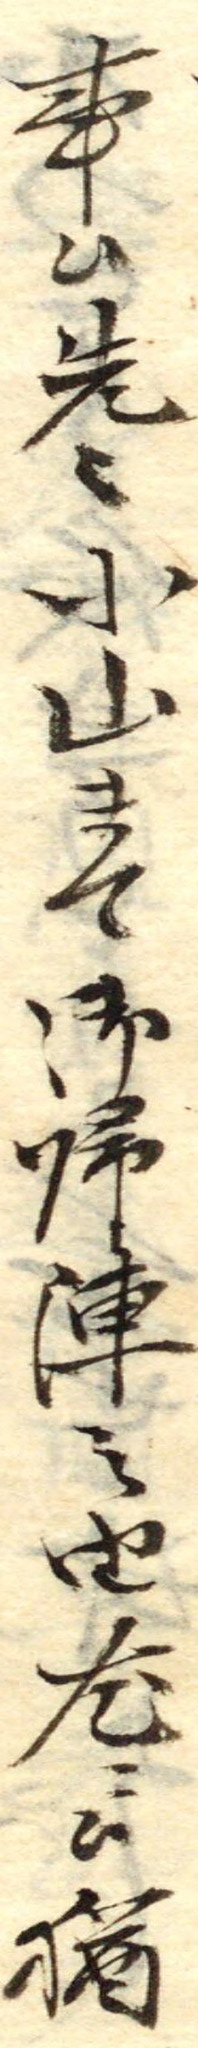事候先々小山まて御帰陣之由尤に候猶
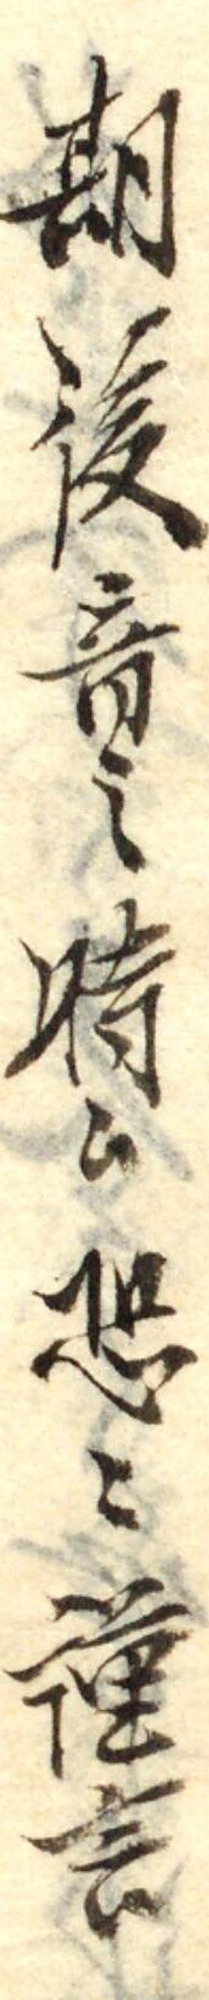期後音之時候恐々謹言
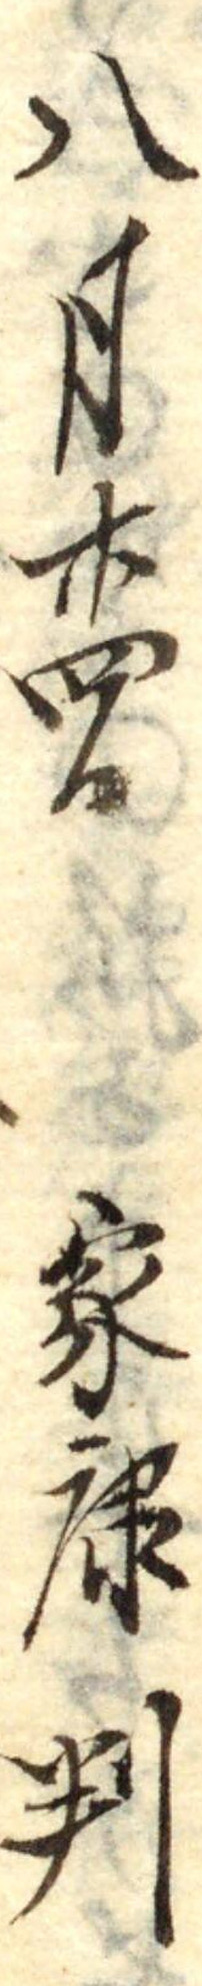八月廿四日家康判
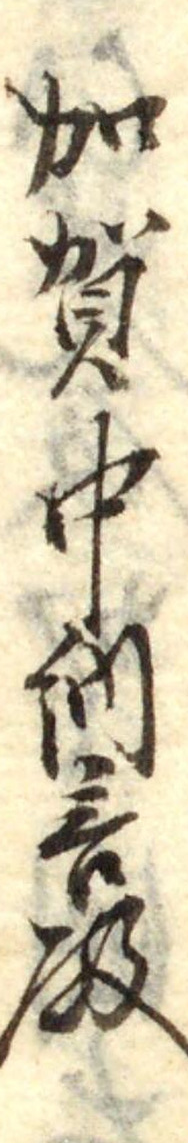加賀中納言殿
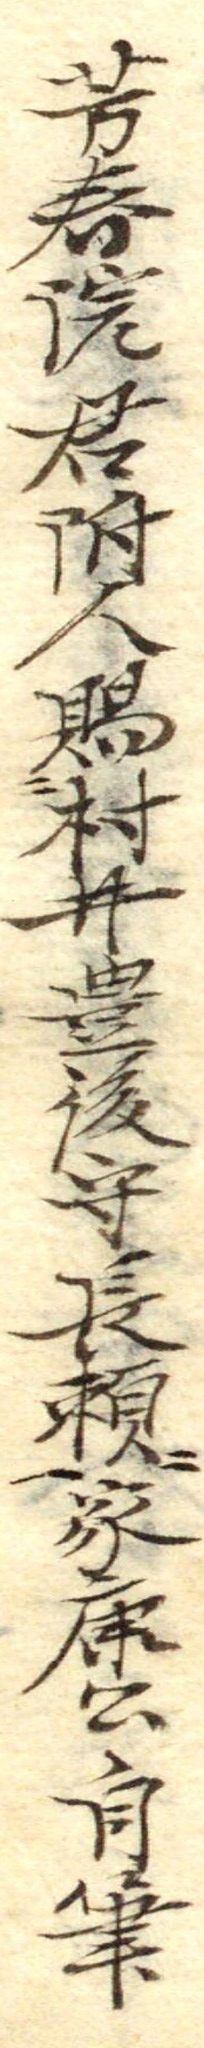芳春院君附人賜村井豊後守長頼に家康公自筆

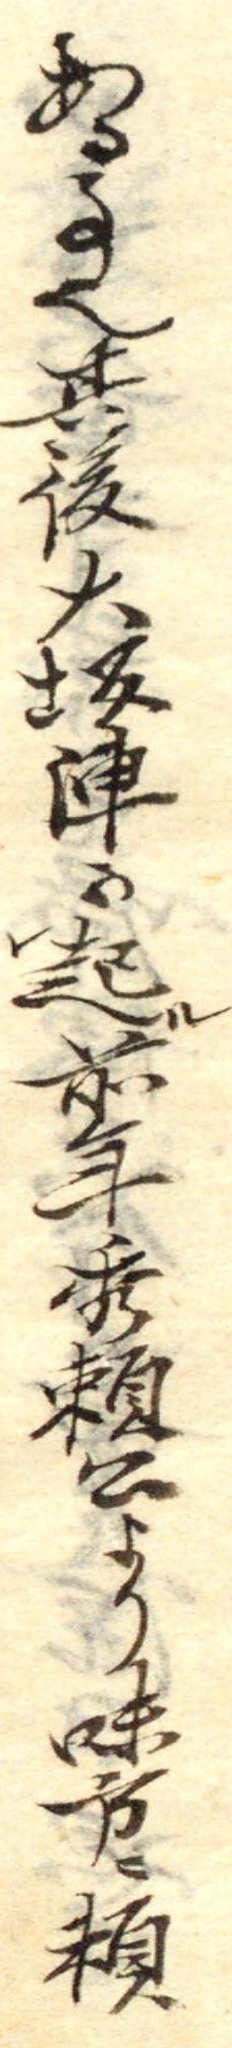ある事也其後大坂陣可起る前年秀頼公より味方に頼
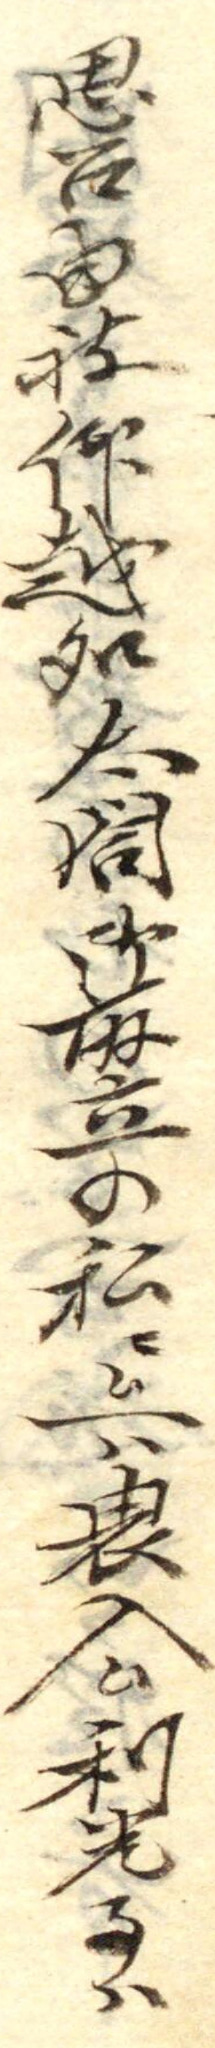思召由被仰越処太閤御取立の私に候へは畏入候利光事は
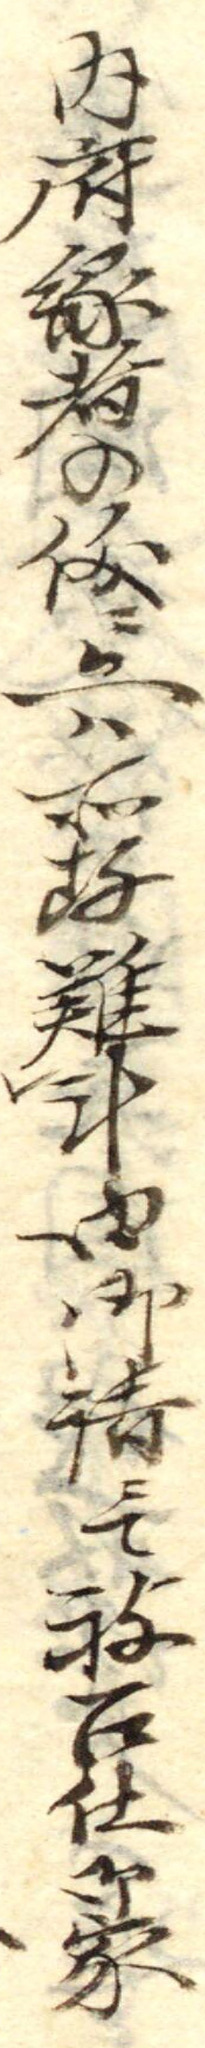内府縁者の儀に候へは所存難斗由御請にて被召仕御家
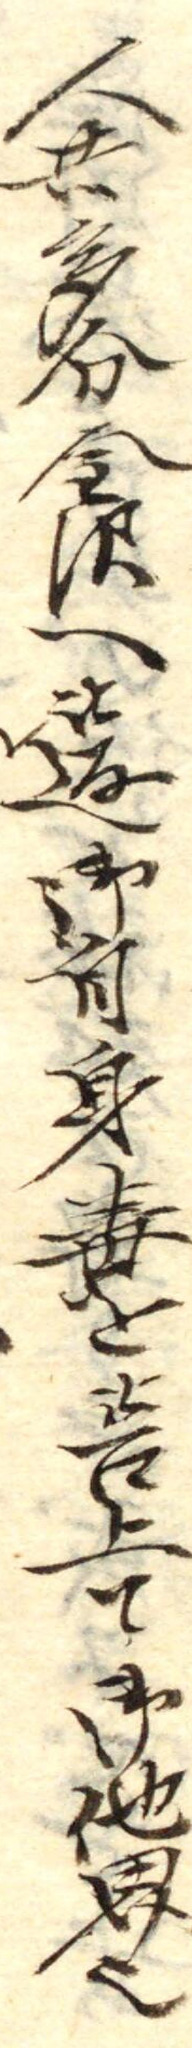人共多分金沢へ被返御自身番を被召上て御他界也
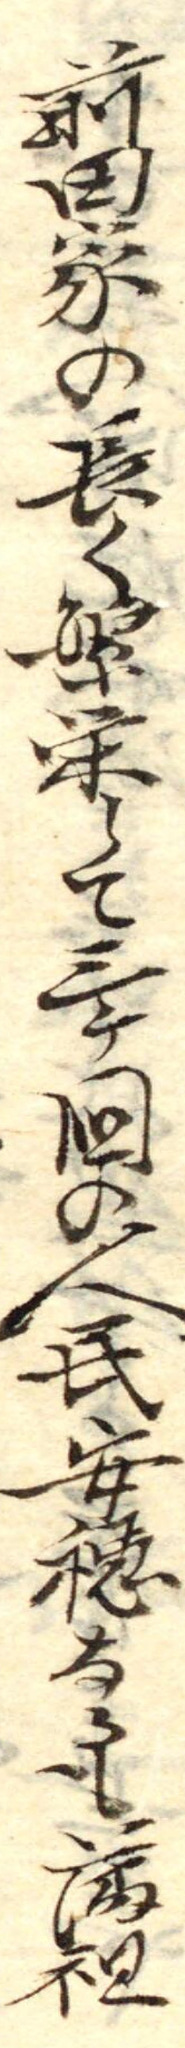前田家の長く繁栄して三け国の人民安穏なるも藩祖
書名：前田家封国証書集録
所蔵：Ishikawa Prefectural Library
